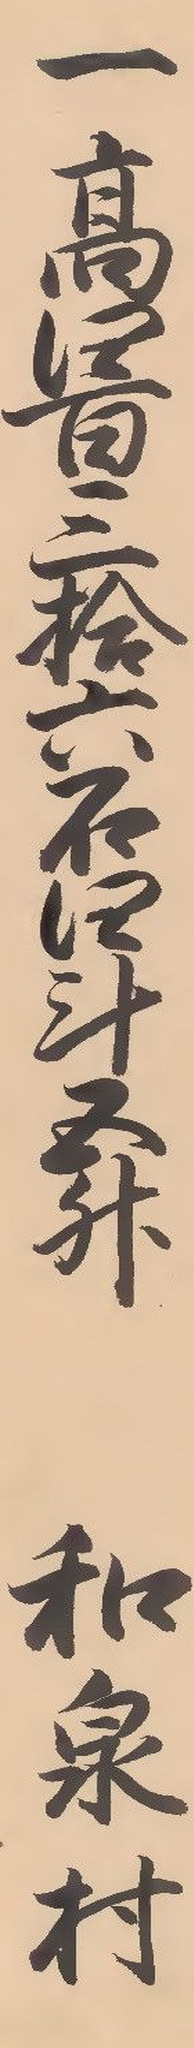一高四百三拾六石四斗五升和泉村

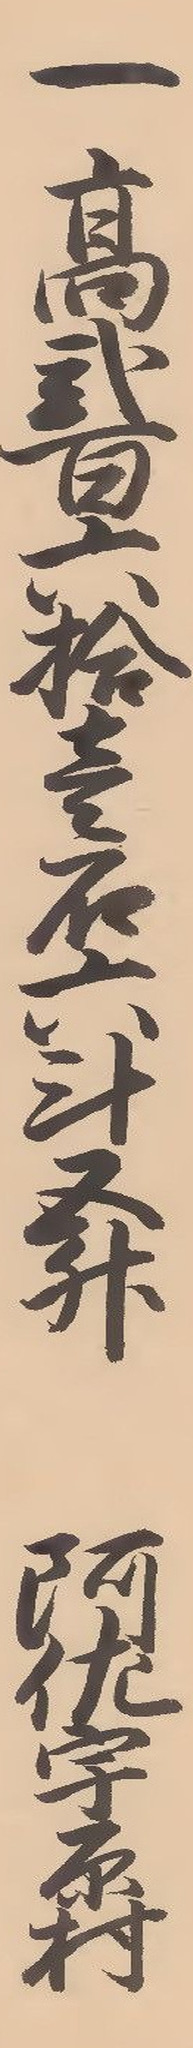一高弐百六拾壱石六斗五升阿佐宇原村
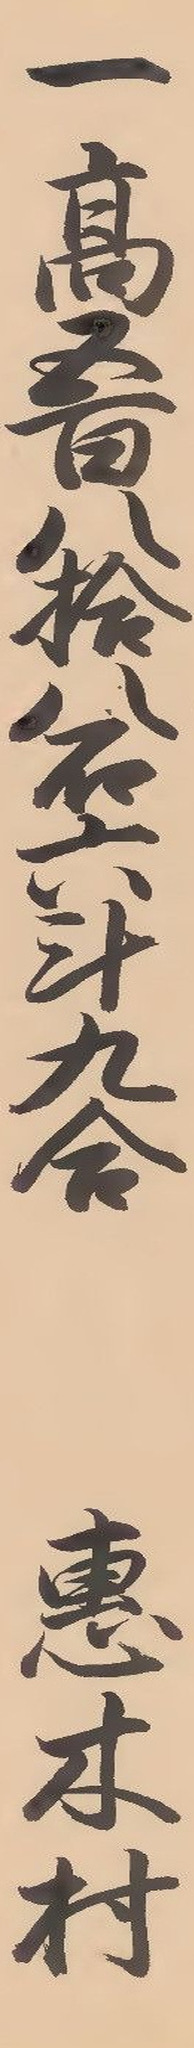一高五百八拾八石六斗九合恵木村
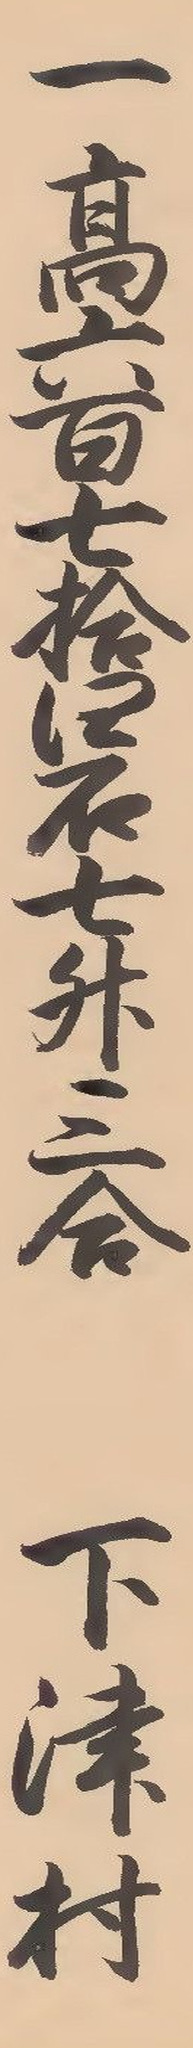一高六百七拾四石七升三合下津村
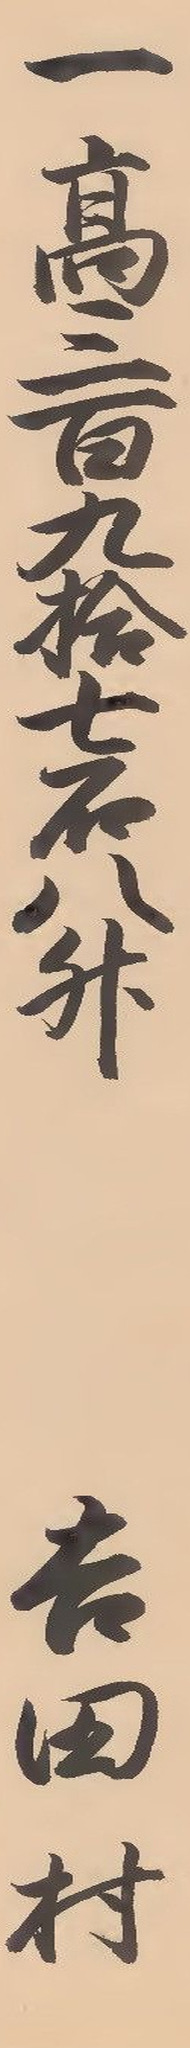一高三百九拾七石八升吉田村
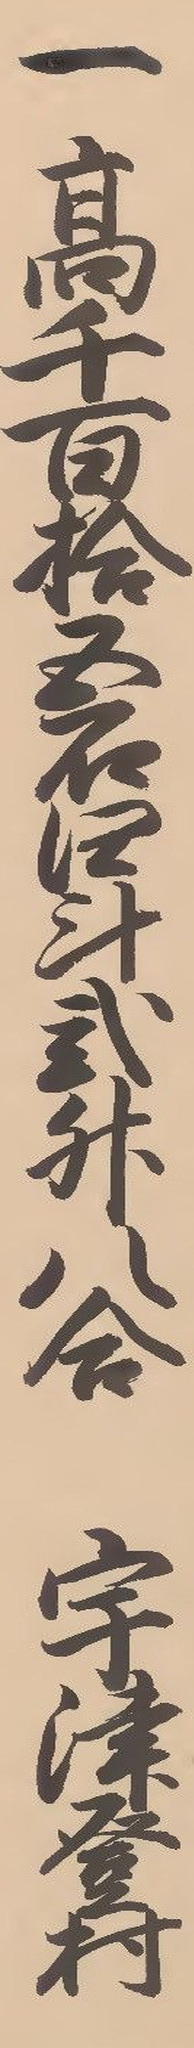一高千百拾五石四斗弐升八合宇津登村
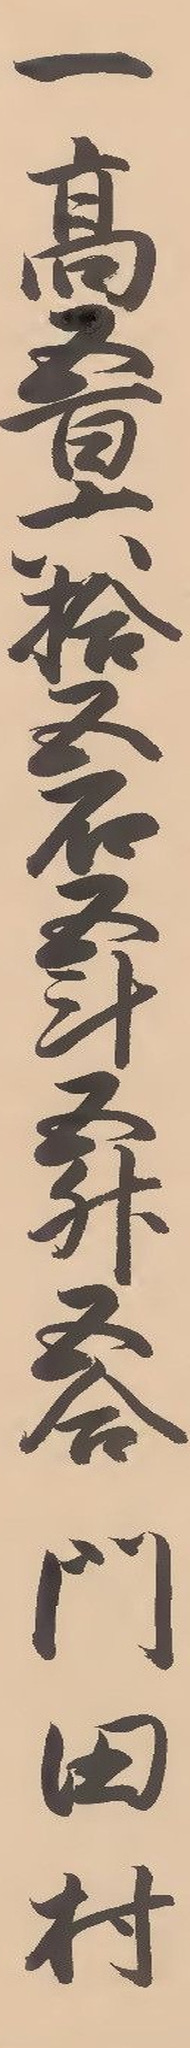一高五百六拾五石五斗五升五合門田村
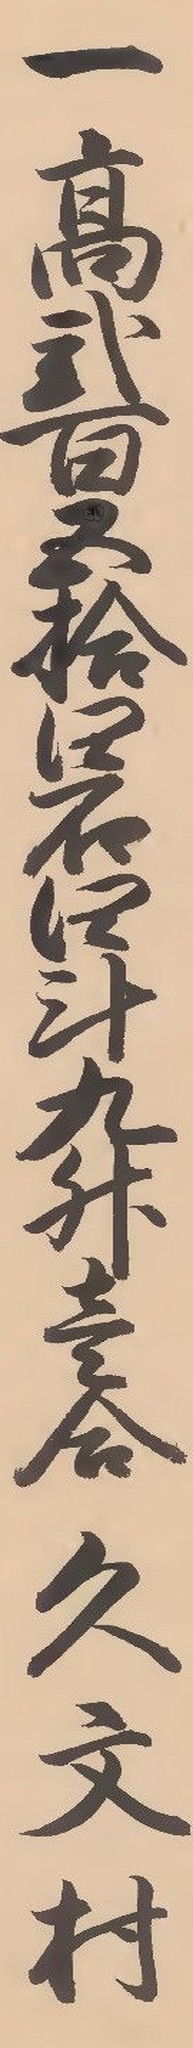一高弐百五拾四石四斗九升壱合久文村
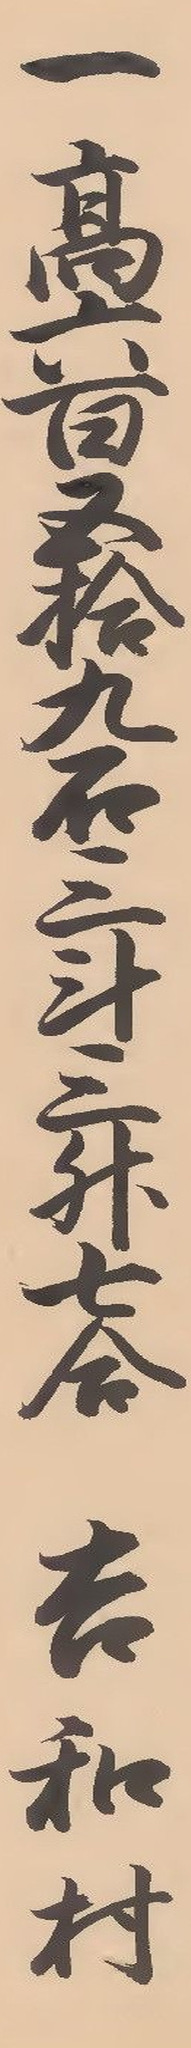一高六百五拾九石三斗三升七合吉和村

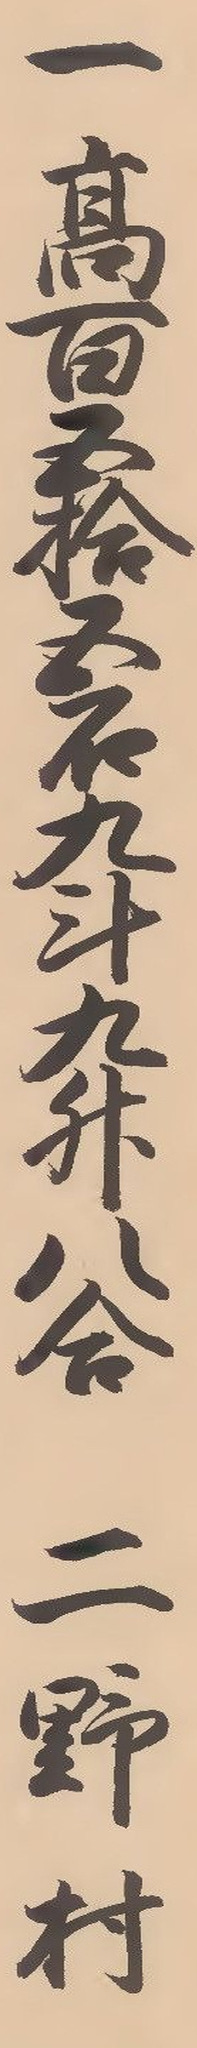一高百五拾五石九斗九升八合二野村
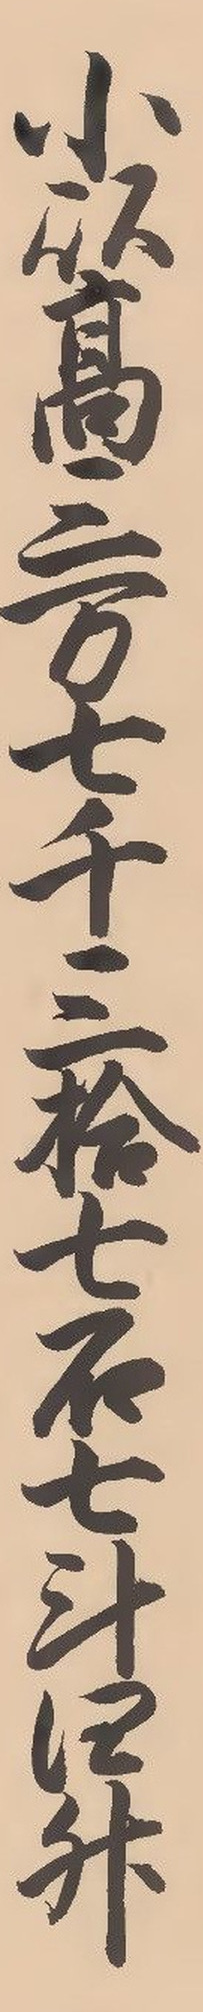小以高三万七千三拾七石七斗四升
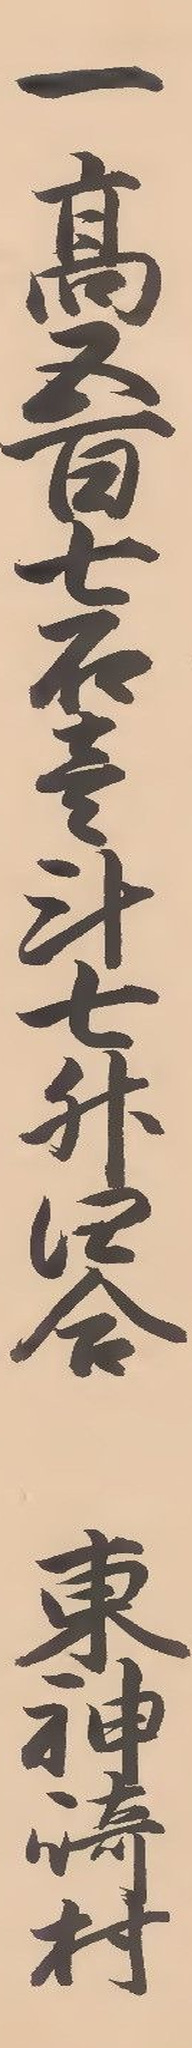一高五百七石壱斗七升四合東神崎村
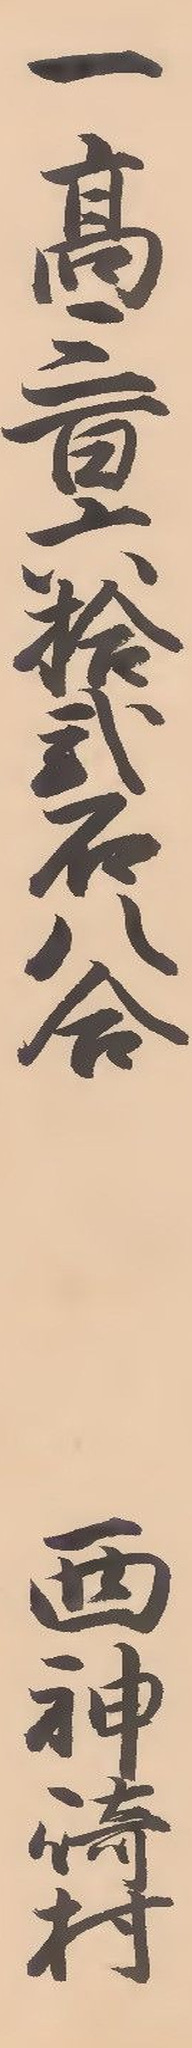一高三百六拾弐石八合西神崎村

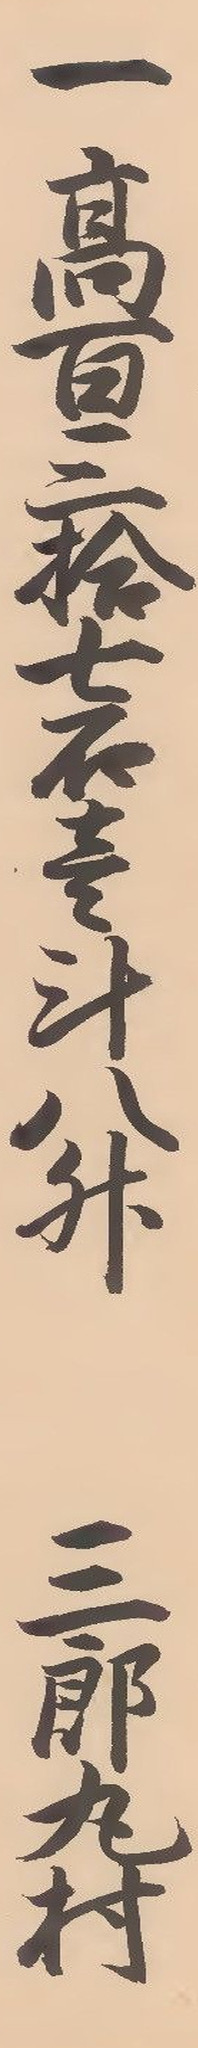一高百三拾七石壱斗八升三郎丸村
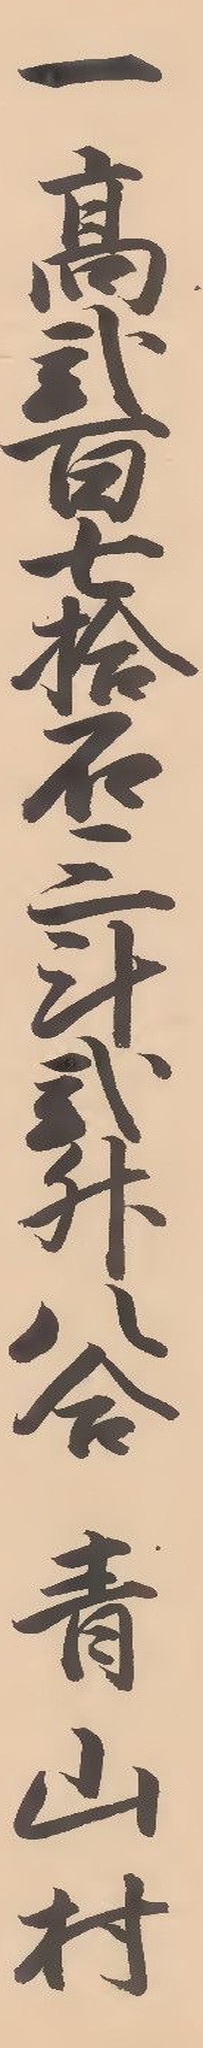一高弐百七拾石三斗弐升八合青山村
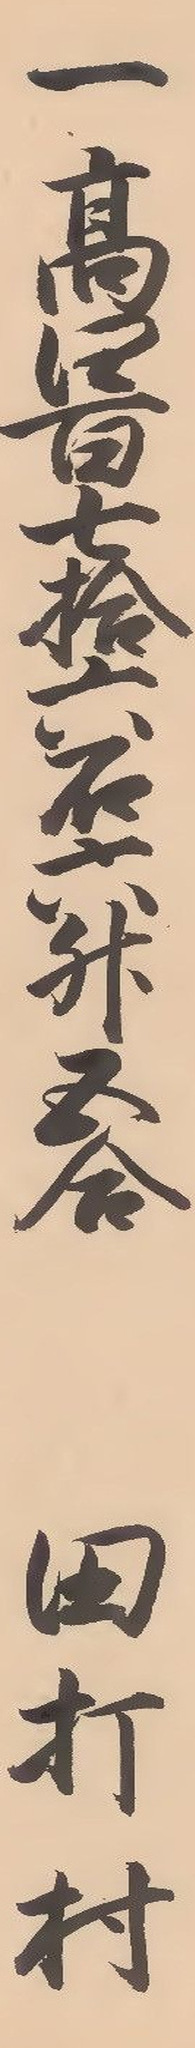一高四百七拾六石六升五合田打村
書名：備後国郷帳
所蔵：国立公文書館 National Archives of Japan
